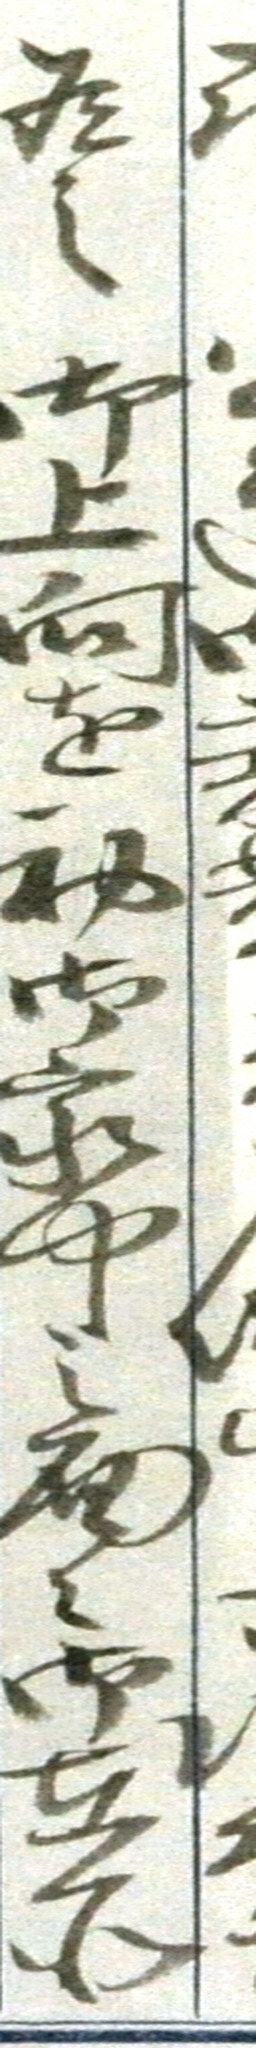有之御上向を初御家中之面々御在所
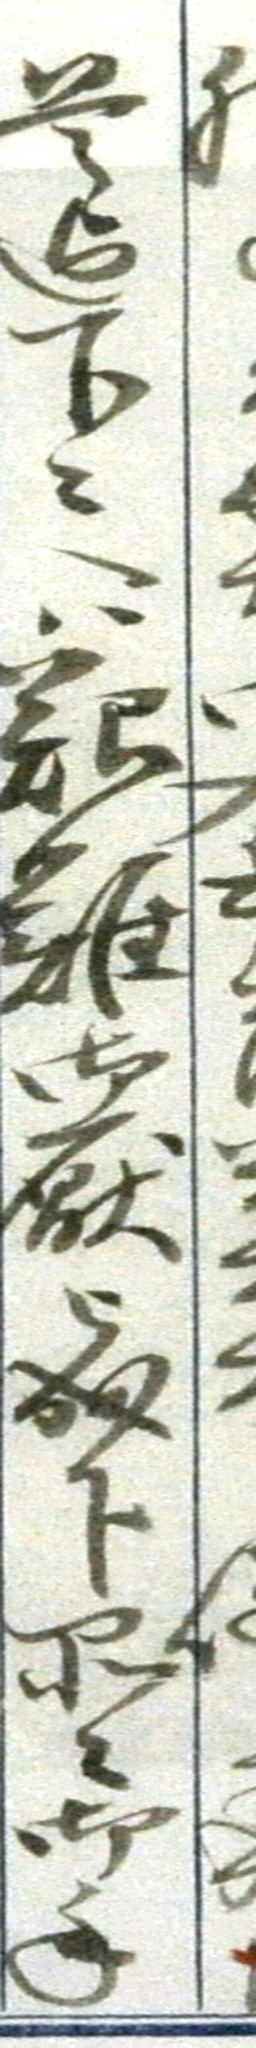是迄下々へハ艱難御厭被成下品々御手
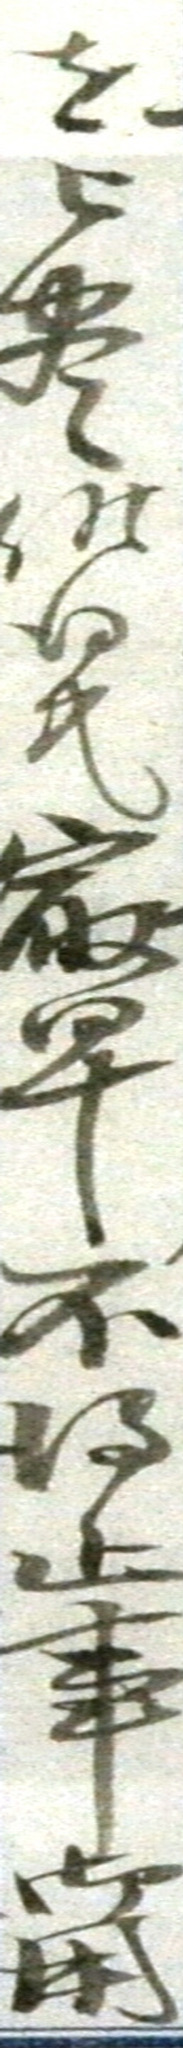を被尽候得共最早不得止事御用
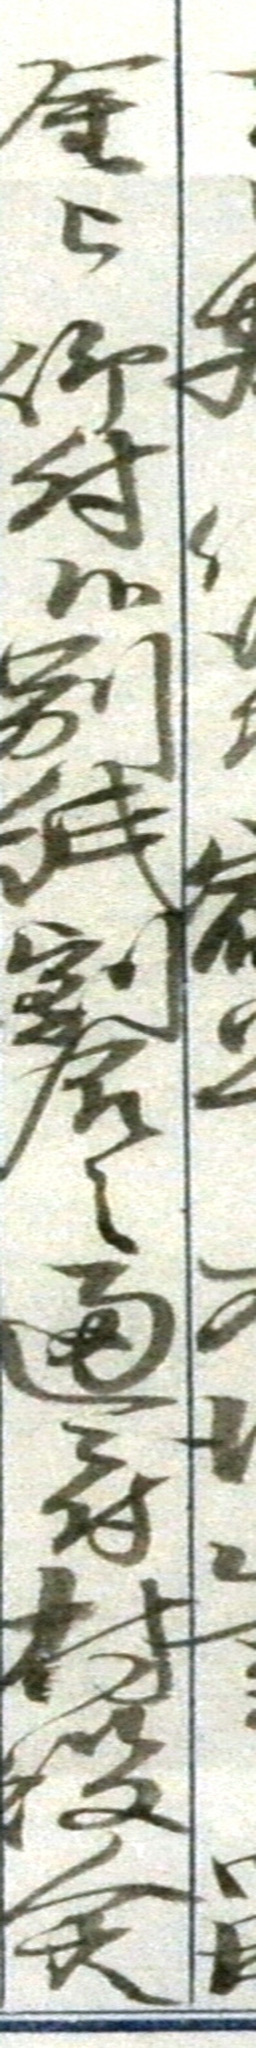金被仰付候別紙割合之通ニ付村役人共
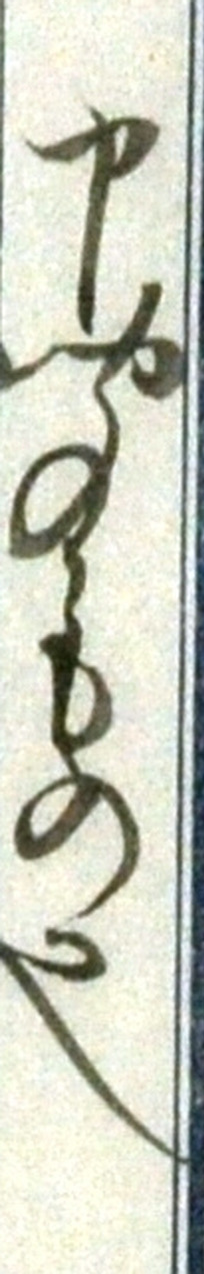申聞もの也
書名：御用金被仰付候御書付
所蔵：伊那市立高遠町図書館・合同会社AMANE
